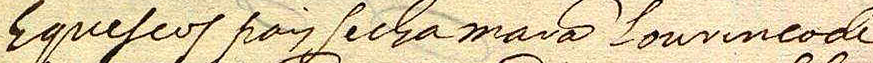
E que seos pais se chamaraõ Lourenco de
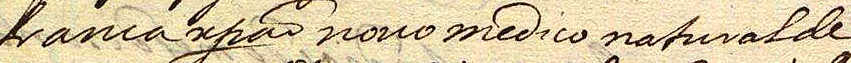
franca xpaõ nouo medico natural de
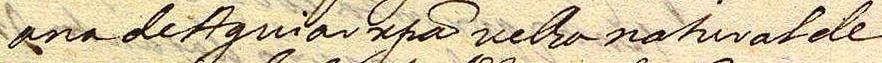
ana de Aguiar xpã uelha natural de
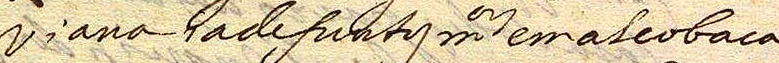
viana ia defuntos mors em alcobaca
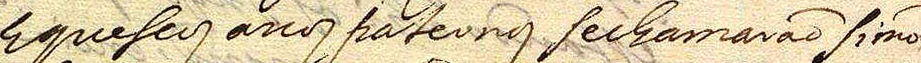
E que seos auos paternos se chamaraõ simō
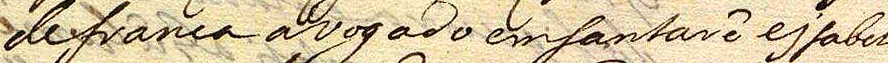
de franca avogado em santarē e jsabel
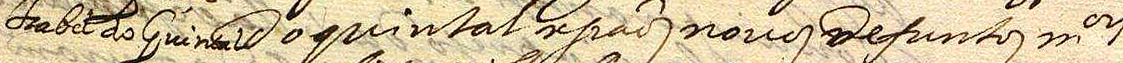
do quintal xpaõs nouos defuntos mors
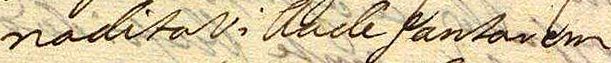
na dita villa de santarem
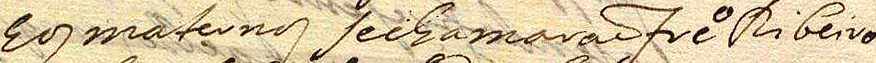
E os maternos se chamaraõ frco Ribeiro
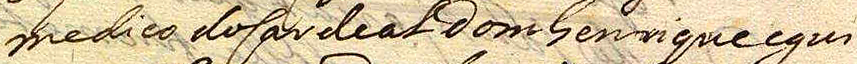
medico do Cardeal dom henrique e gui
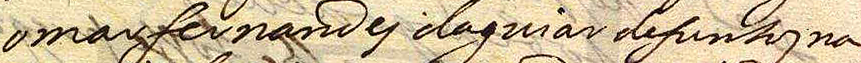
omar fernandes daguiar defuntos na
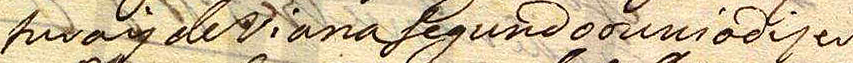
turais de viana segundo ouuio dizer
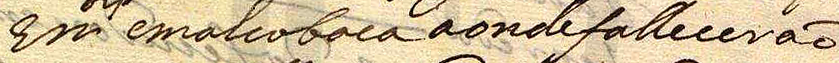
E mors em alcobaca aonde falleceraõ
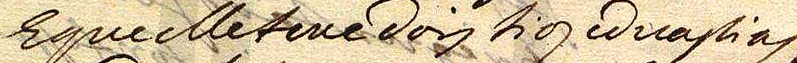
E que elle teue dois tios e duas tias
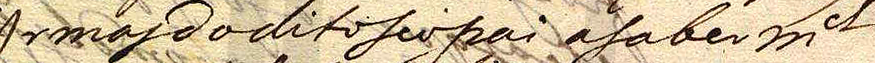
Irmas do dito seo pai a saber mel
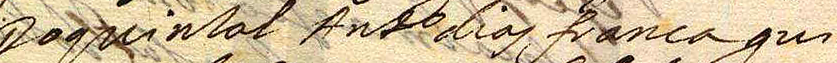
do quintal Anto dias franca gui
